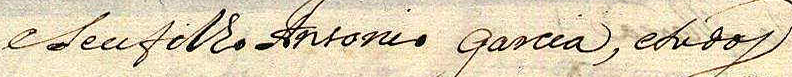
e seu filho Antonio garcia, e todos
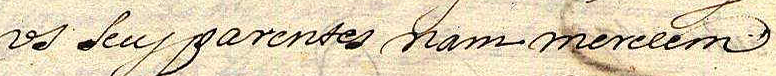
os seus parentes nam merecem
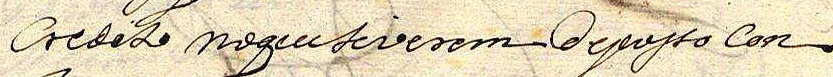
credito no que tiverem deposto con
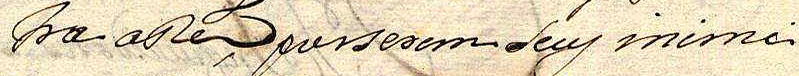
tra a Re, por serem seus inimi
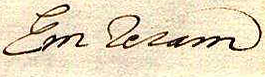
Em Rezam
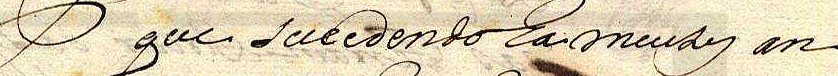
P que sucedendo ha muitos an
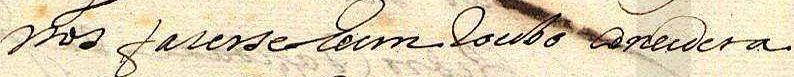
nos fazerse hum Roubo considera
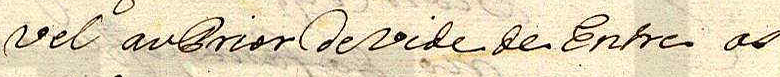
vel ao Prior de vide de Entre as
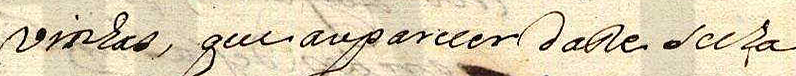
vinhas, que ao parecer da Re se cha
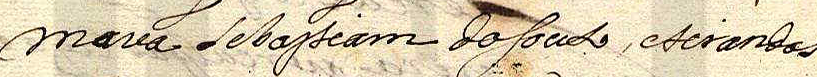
mava Sebastiam do Souto, e tirandos
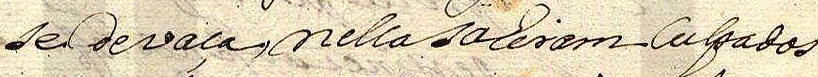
se devaça, nella sahiram culpados
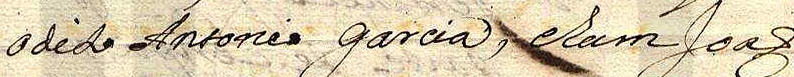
o dito Antonio garcia, e hum Joaõ
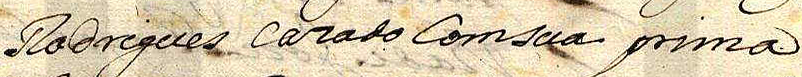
Rodrigues cazado com sua prima
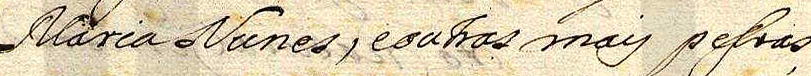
Maria Nunes, e outras mais pessoas
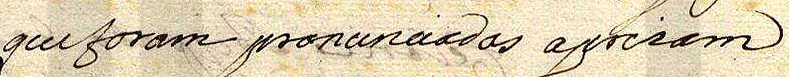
que foram pronunciadas a prizam
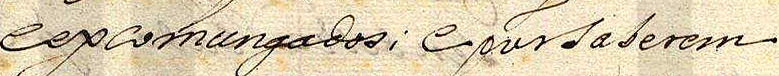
e excomungados; e por saberem
